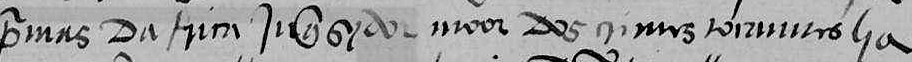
p̄imas Dafrica Jnq̄sydor moor dos crimes tocamtes ha
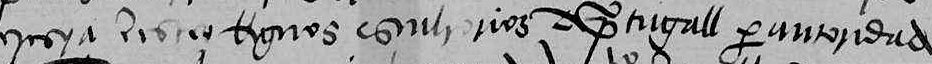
eresya ē estes Regnos e senhorios de p̄otugall ꝑ autoridade
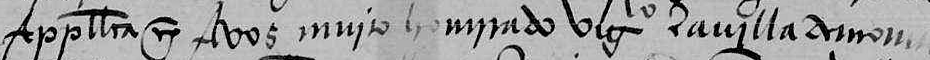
App̄llca c̄ꝭ A vos mujto homrrado Vigro ē a ujlla de momte
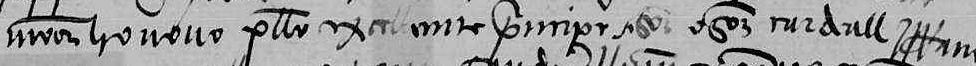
m̄oor ho nouo p̄llo excellemte pincipe e s̄or o s̄or cardeall Jffam
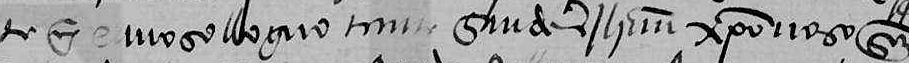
te c̄ꝭ e a uoso lloguo temte Saude ē Jhūu xp̄o noso s̄or
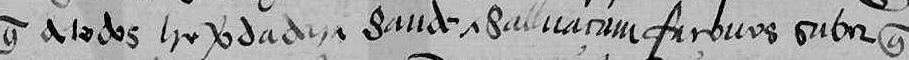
q̄ de todos he ꝟdadeira Saude e Salluaçam façouos saber q̄
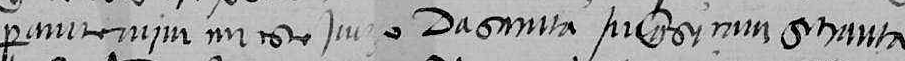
ꝑamte mjm em este Juizo Da samta Jmq̄syçam se trauta
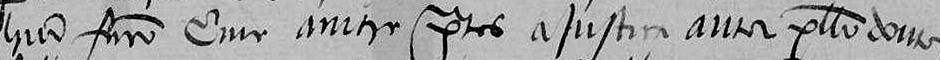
hū fec̄o C̄ime amtre p̄tes a Justica autor p̄llo doutor
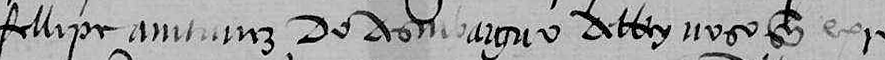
fellipe amtunez Do Desenbarguo Del Rey noso s̄or e pro
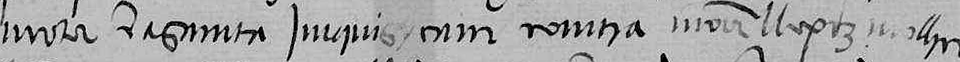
motor ē a samta Jmquisyçam comtra mōor llopez molher
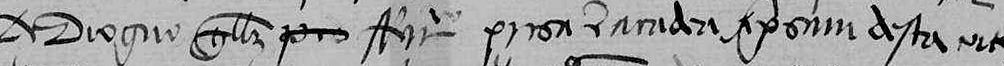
De Dioguo ḡllz pes fferrro presa ē a cadea e p̄isam desta corte
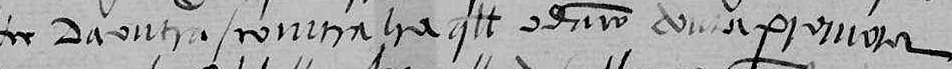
Ree Da outra / comtra ha q̄ll o dicto doutor promotor
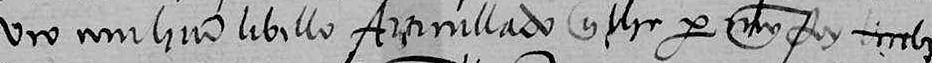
veo com hū libello Articullado q̄ lhe ꝑ mȳ foy Receby
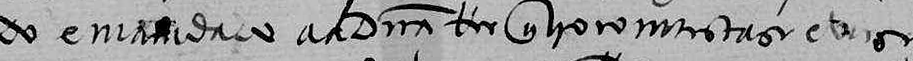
do e mamdado aa Dita Ree q̄ ho comtestase e viese
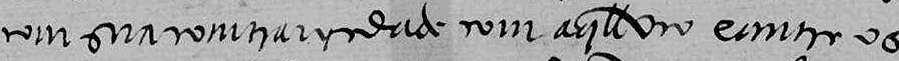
com sua comtraryedade com a q̄ll veo e antre os
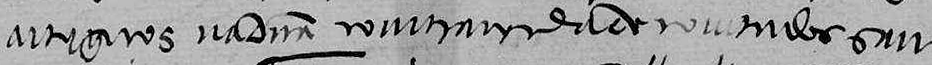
artyguos na dita comtraryedade comteudos sam
